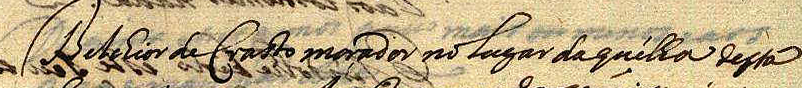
Belchior de Crasto morador no lugar da quilha desta
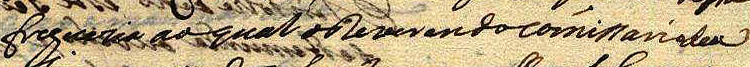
freguezia ao qual o Reverendo com̄issario deu
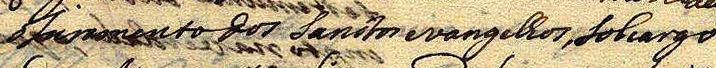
o Iuramento dos sanctos evangelhos, sob cargo
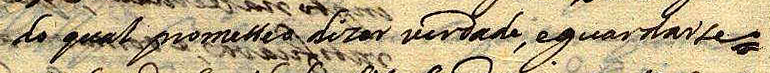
do qual prometteo dizer verdade, e guardar se
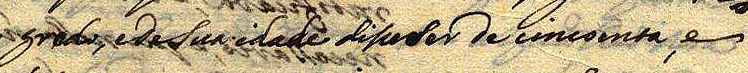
gredo, e de sua idade disse ser de cincoenta, e
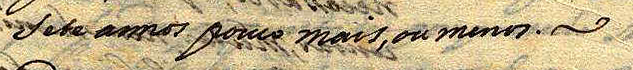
sete annos pouco mais, ou menos. -
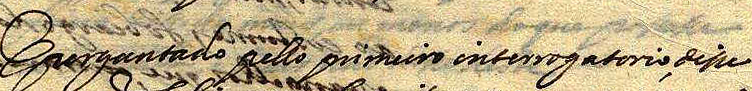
E perguntado pello primeiro interrogatorio, disse
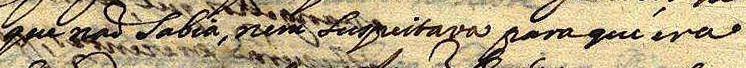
que naõ sabia, nem suspeitava para que era
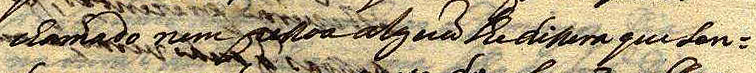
chamado nem pessoa alguā lhe dissera que sen
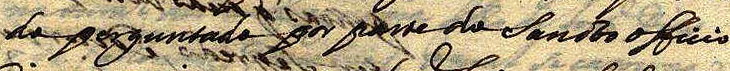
do perguntado por parte do Sancto officio
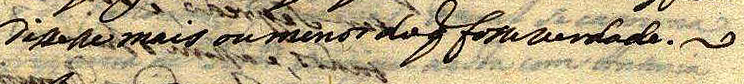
dissesse mais ou menos do q̄ fosse verdade. -
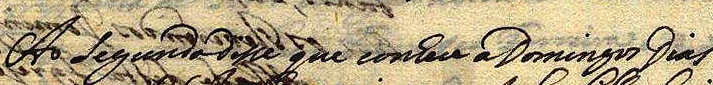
Ao segundo disse que conhece a Domingos Dias
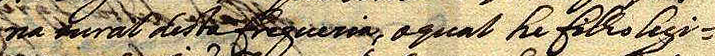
natural desta freguezia, o qual he filho legi
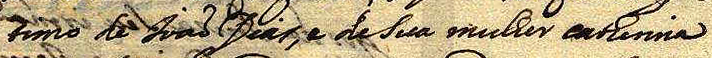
timo de Ioaõ Dias, e de sua mulher catherina
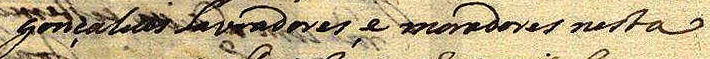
gonçalues Lavradores, e moradores nesta
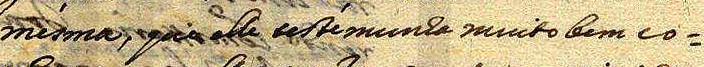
mesma, que elle testemunha muito bem co
